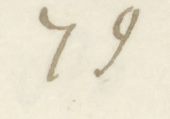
79
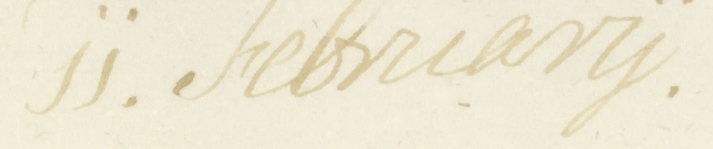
ii. Februarij.
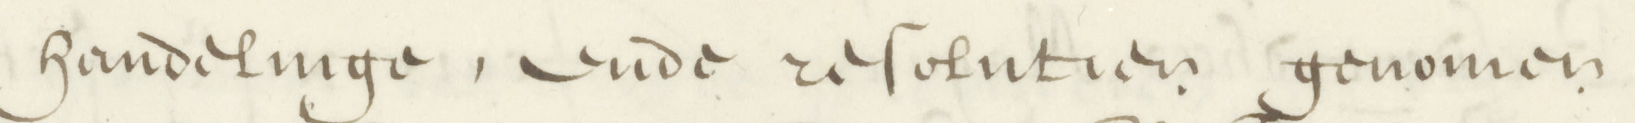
handelinge, ende resolutien genomen
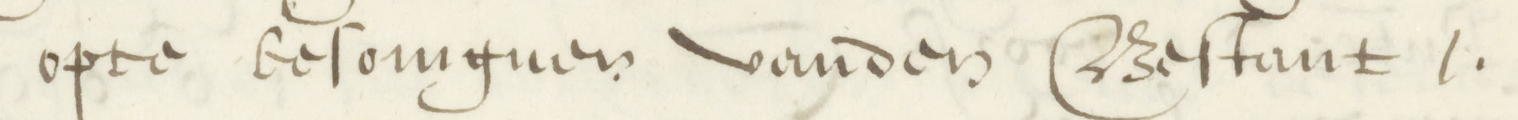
opte besoingnen vanden Bestant.
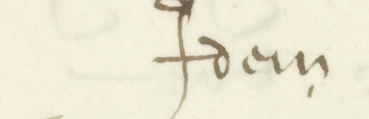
Idem
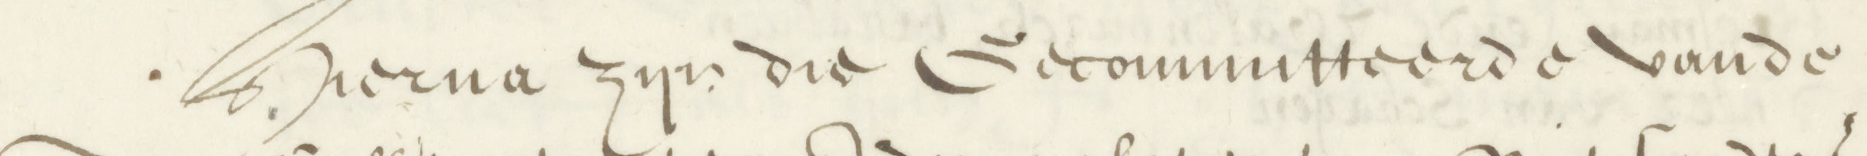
Hierna zyn die Gecommitteerde vande
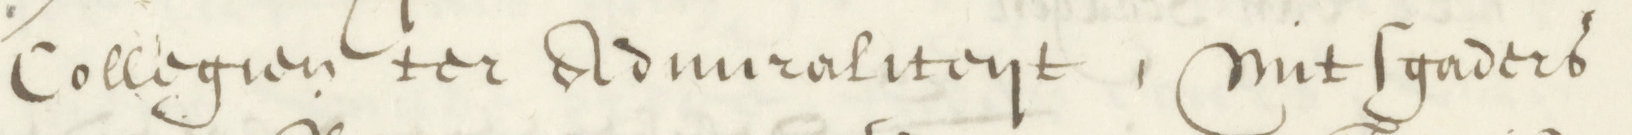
Collegien ter Admiraliteyt, mitsgaders
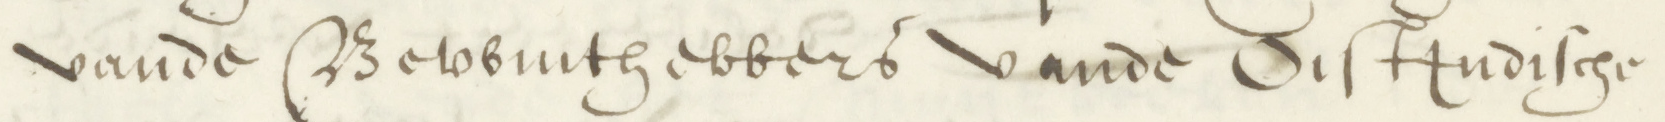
vande Bewinthebbers vande OistIndische
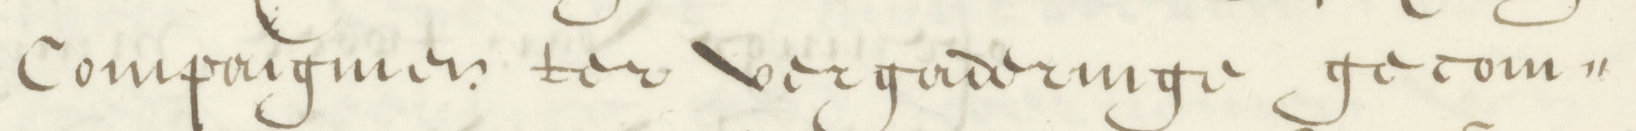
Compaignien ter vergaderinge gecom,,
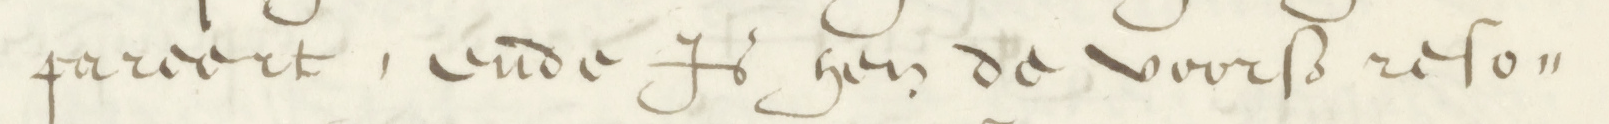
pareert, ende Is hen de voors reso,,
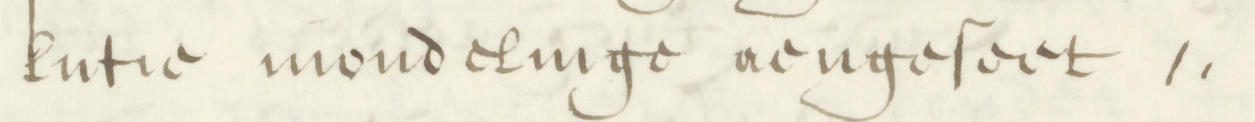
lutie mondelinge aengeseet.
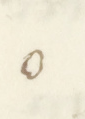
o
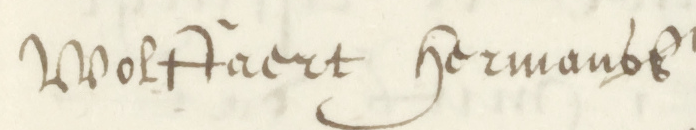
Wolffaert Hermansz
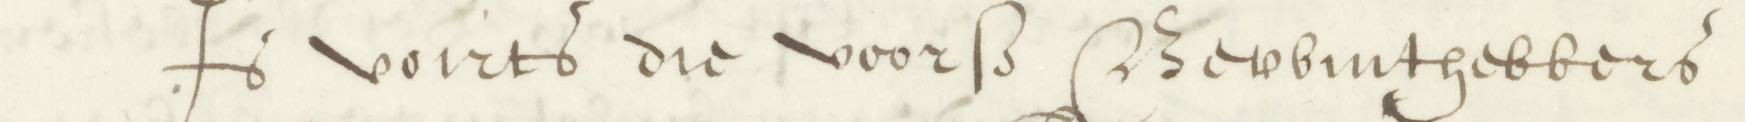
Is voirts die voors Bewinthebbers
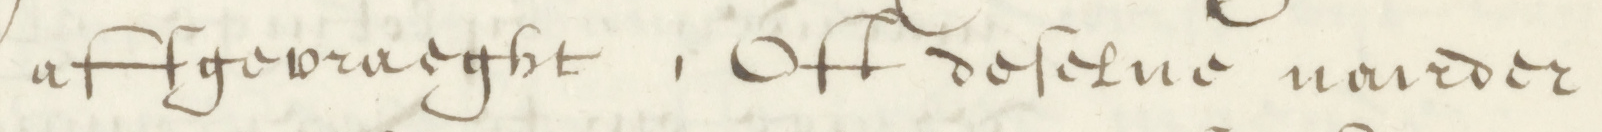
affgevraeght, Off deselue nairder
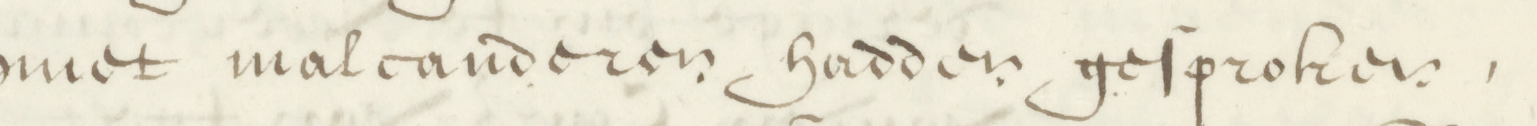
met malcanderen hadden gesproken,
